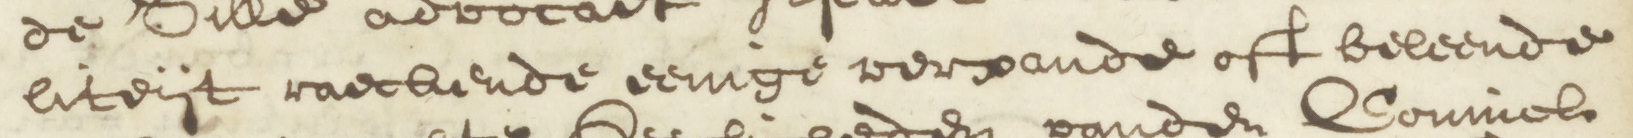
liteijt raeckende eenige verpande off beleende
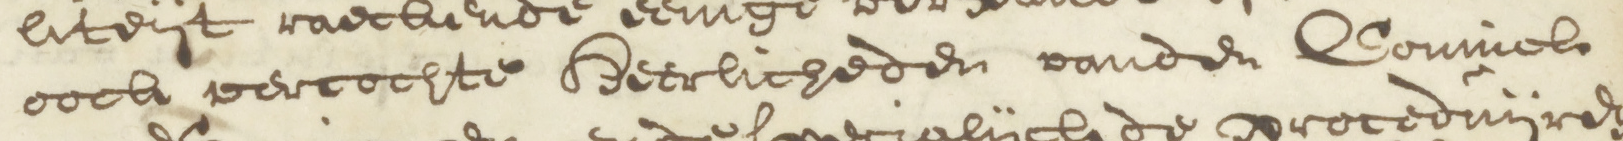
oock vercochte Heerlicheden vanden Coninck
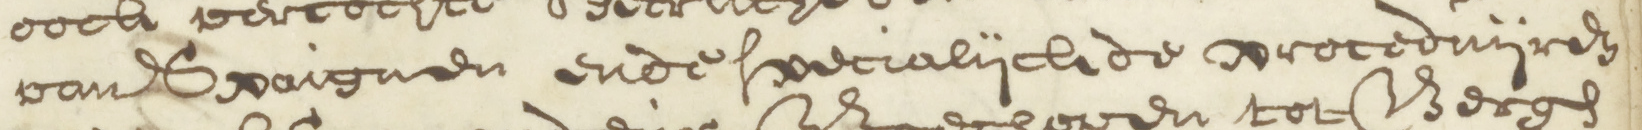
van Spaignen ende specialijck de proceduijren
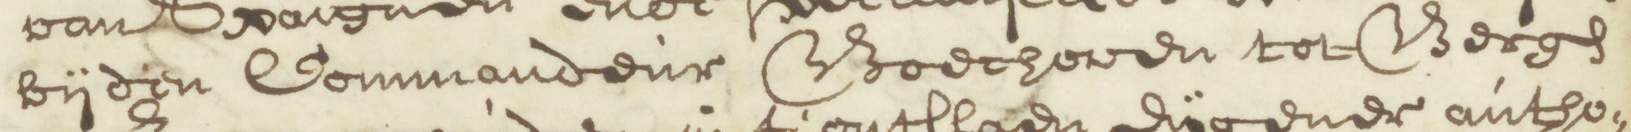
bij den Commandeur Boechoven tot Bergen
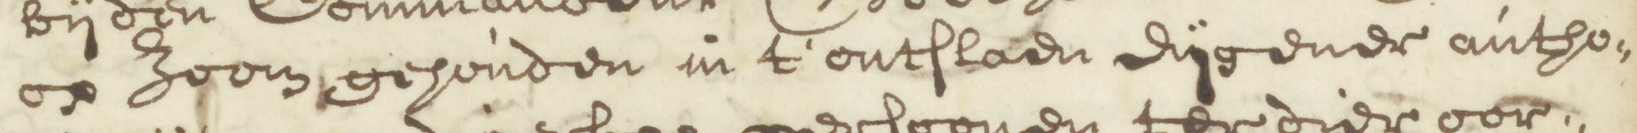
op Zoom gehouden in t‛ontslaen eijgener autho„
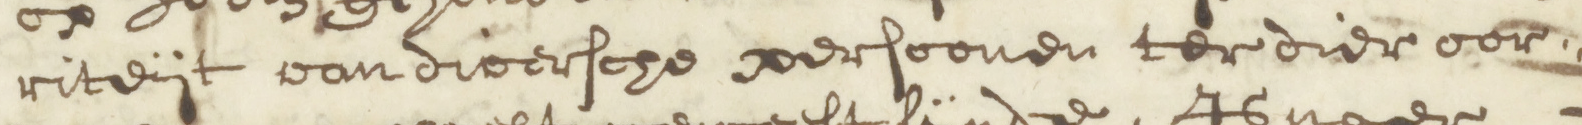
riteijt van diversche persoonen ter dier oor„
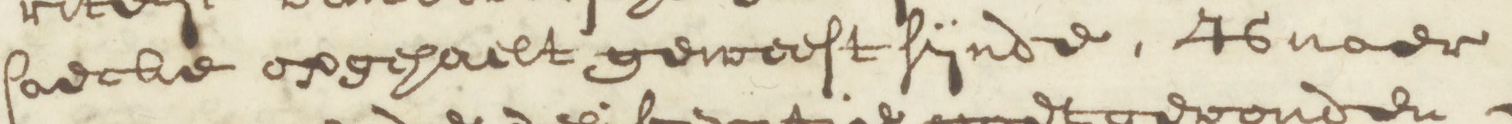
saecke opgehaelt geweest sijnde. Is naer
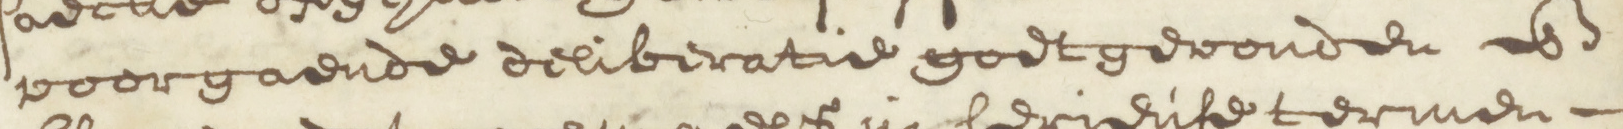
voorgaende deliberatie goetgevonden &
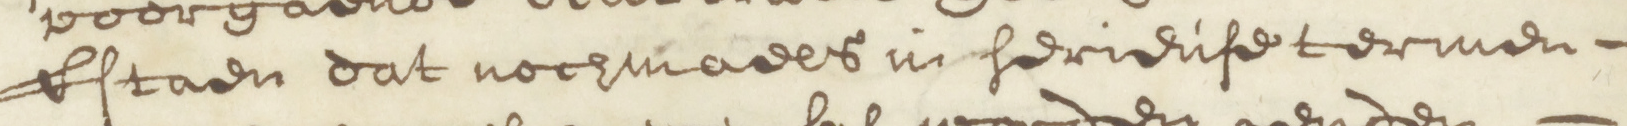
vstaen dat nochmaels in serieuse termen -
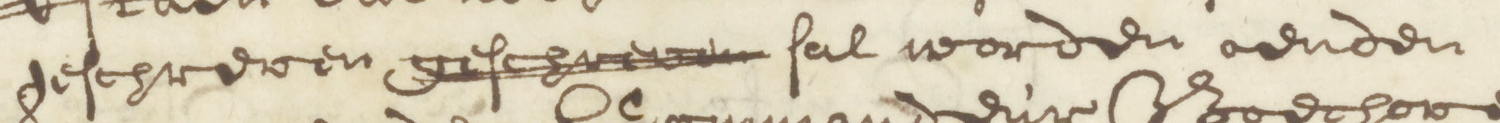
geschreven geschreven sal worden aenden
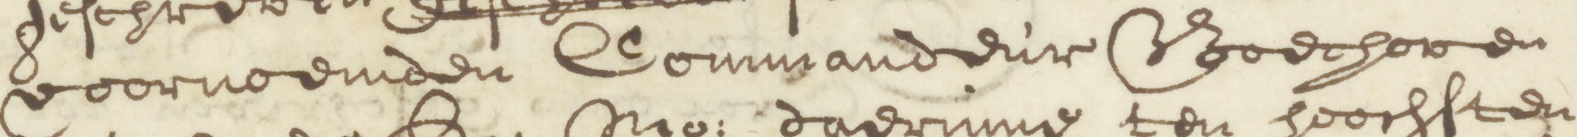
voornoemden Commandeur Boechoven
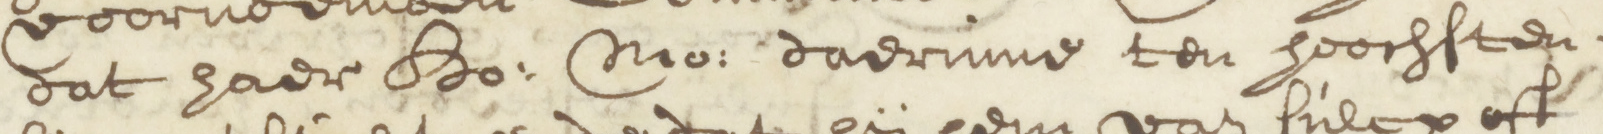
dat haer Ho:Mo: daerinne ten hoochsten
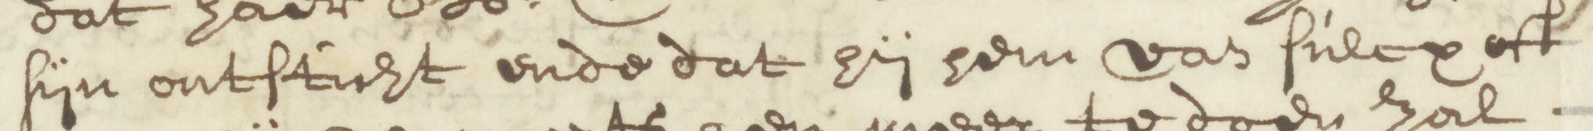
sijn ontsticht ende dat hij hem van sulcx off
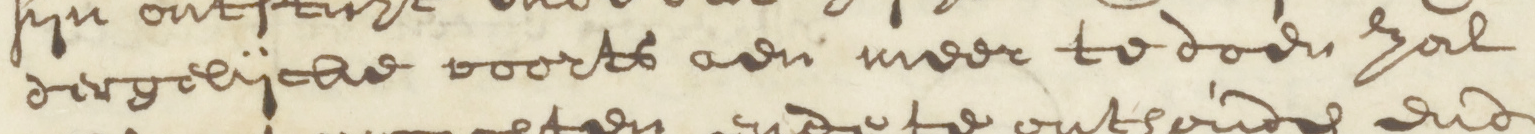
dergelijcke voorts aen meer te doen zal
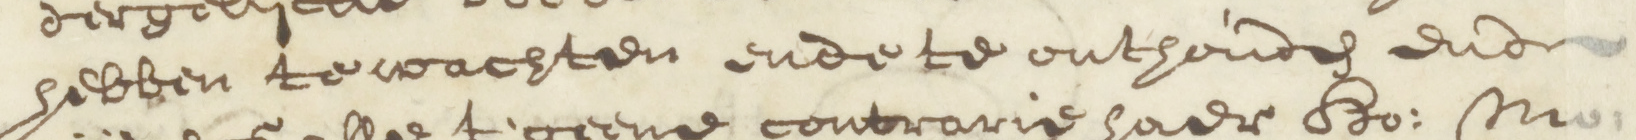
hebben te wachten ende te onthouden ende
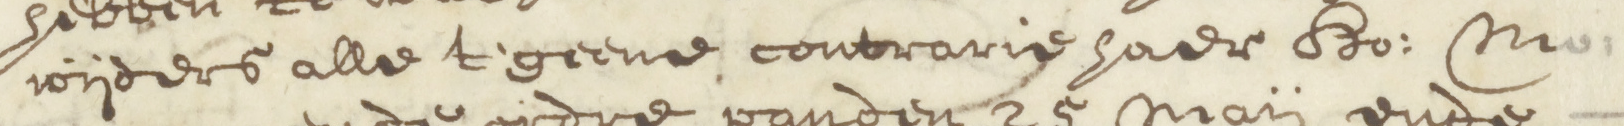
wijders alle t‛geene contrarie haer Ho:Mo:
